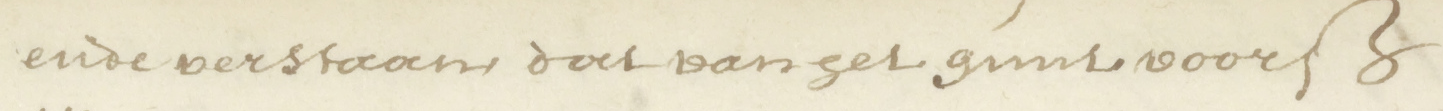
ende verstaan doet van het gunt voorsz
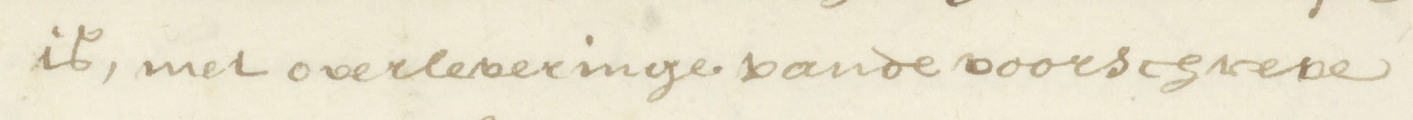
is, met overleveringe vande voorschreve
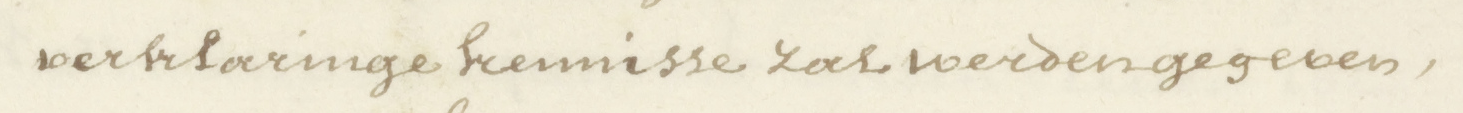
verklaringe kennisse zal werden gegeven,
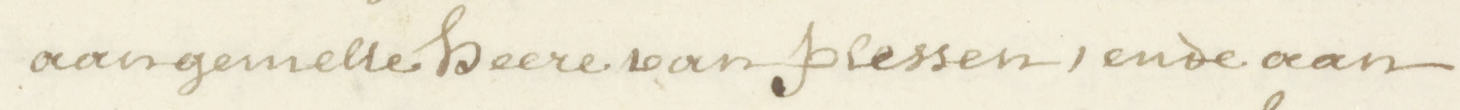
aangemelte heere van Plessen, ende aan
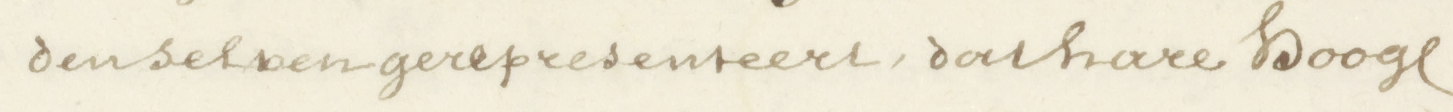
denseleven gerepresenteert, dat hare Hoogh
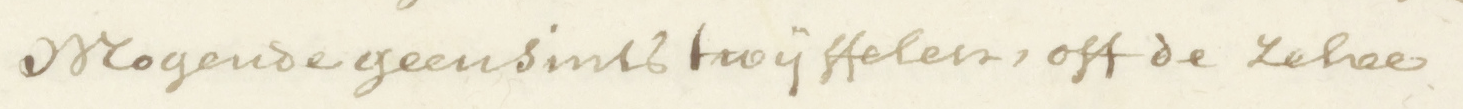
Mogende geensints twijffelen, off de zelve
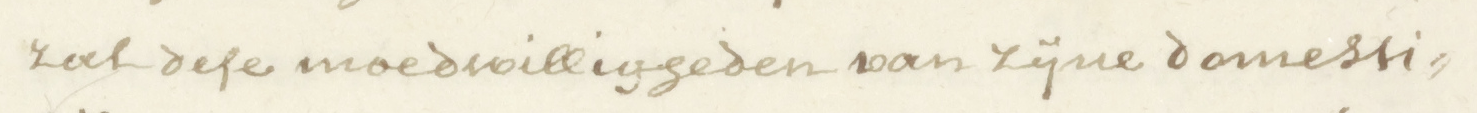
zal dese moedwilligheden van zijne domesti„
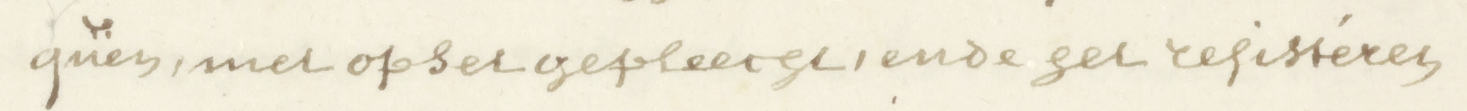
quën, met opset gepleecht, ende het registeren
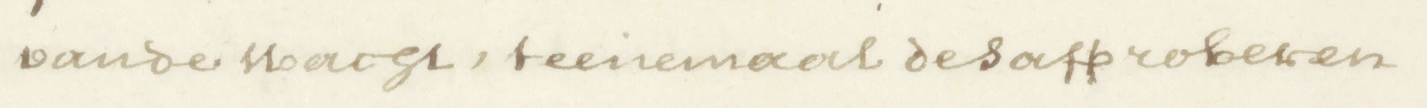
vande wacht, teenemaal desapproberen
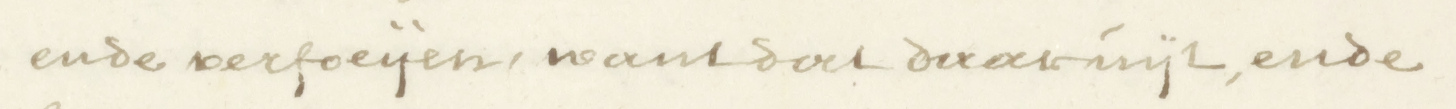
ende verfoeijen, want dat daaruijt, ende
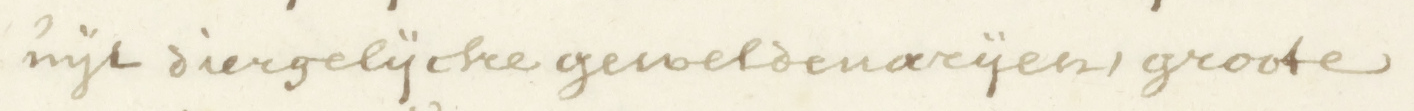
uijt diergelijcke geweldenarijen, groote
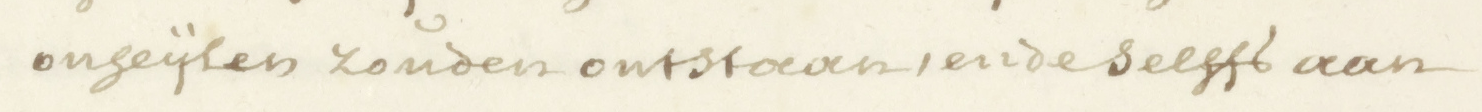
onheijlen zouden ontstaan, ende selffs aan
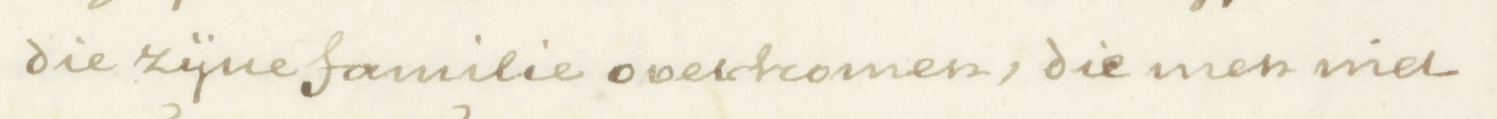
die zijne familie overkomen, die men niet
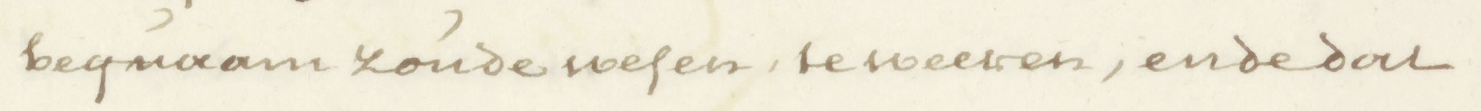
bequaam zoude wesen, te weeten, ende dat
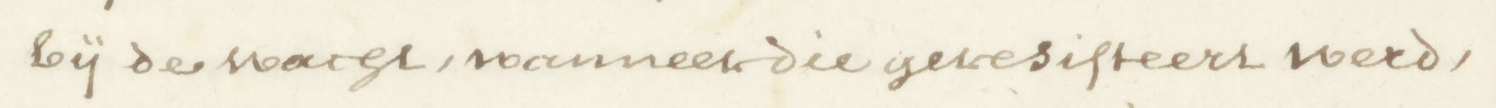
bij de wacht, wanneer die geresisteert werd,
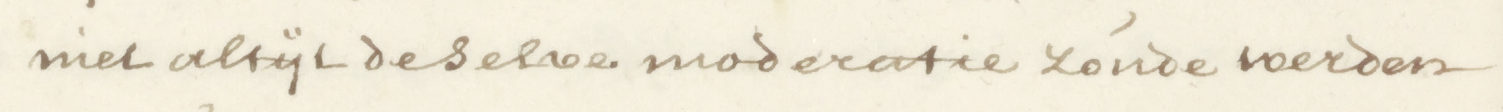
niet altijt deselve moderatie zoude werden
